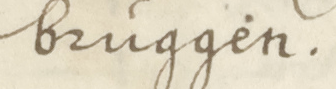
bruggen.
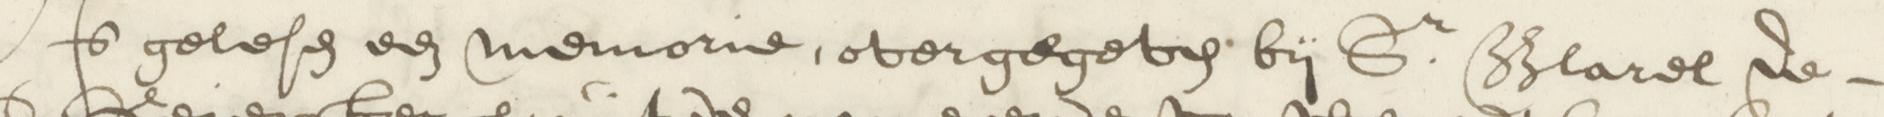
Is gelesen een memorie, overgegeven bij Sr. Blarel de
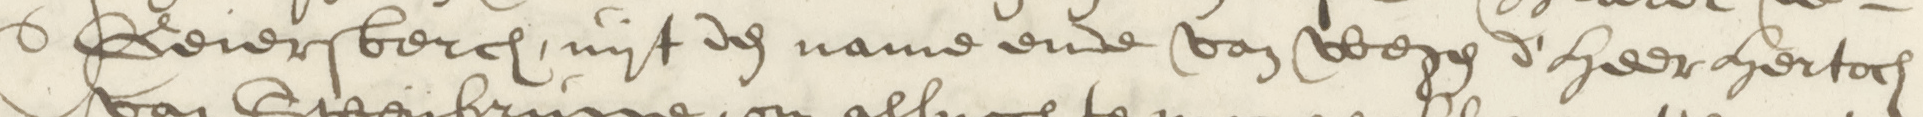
Geiersberch, uijt den name ende van wegen d'Heer Hertoch
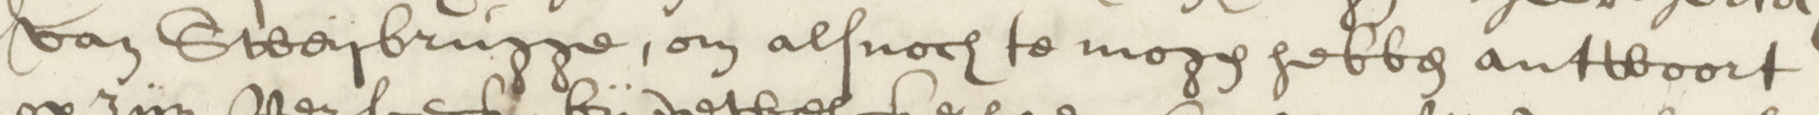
van Sweijbrugge, om alsnoch te mogen hebben antwoort
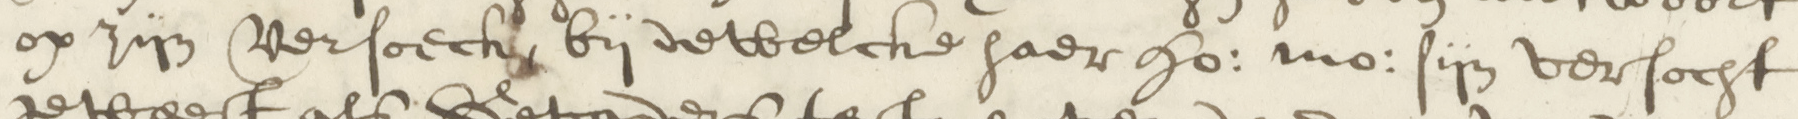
op zijn Versoeck, bij dewelcke haer Ho:Mo: sijn versocht
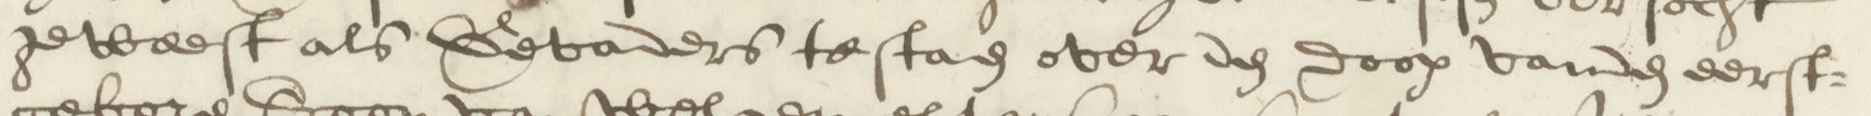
geweest als Gevaders te staen over den doop vanden eerst„
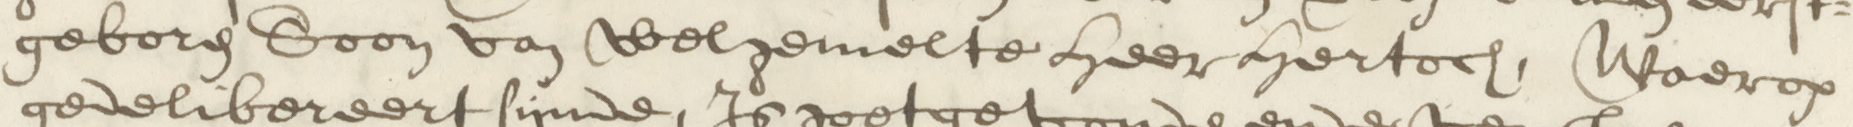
geboren Soon van welgemelte Heer Hertoch. Waerop
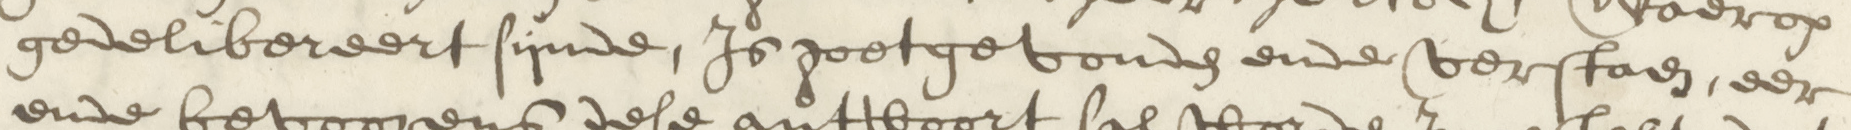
gedelibereert sijnde, Is goetgevonden ende verstaen, eer
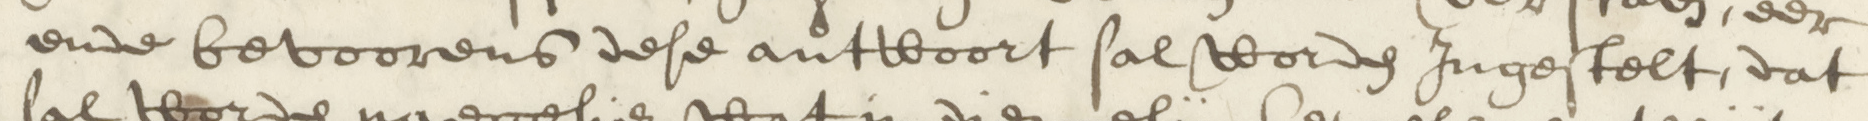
ende bevoorens dese antwoort sal worden Ingestelt, dat
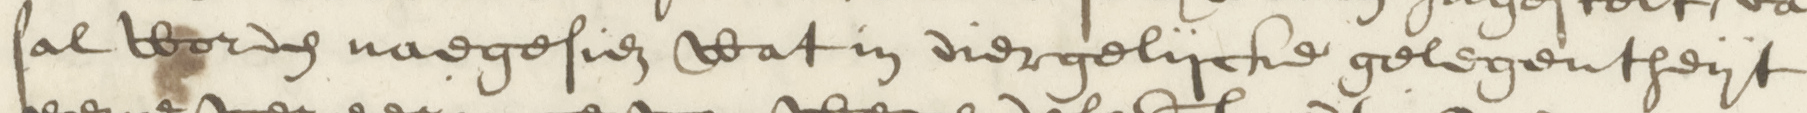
sal worden naegesien wat in diergelijcke gelegentheijt
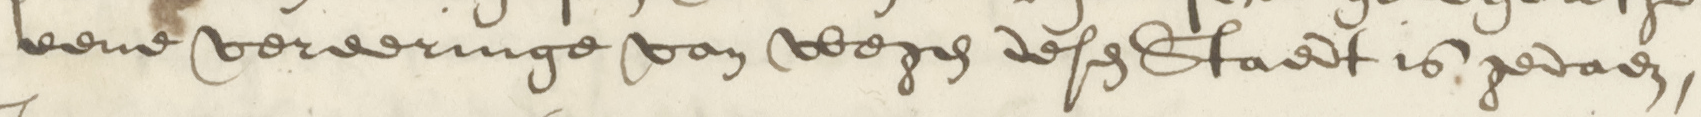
eene vereeringe van wegen desen Staedt is gedaen.
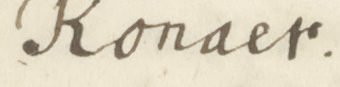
Ronaer.
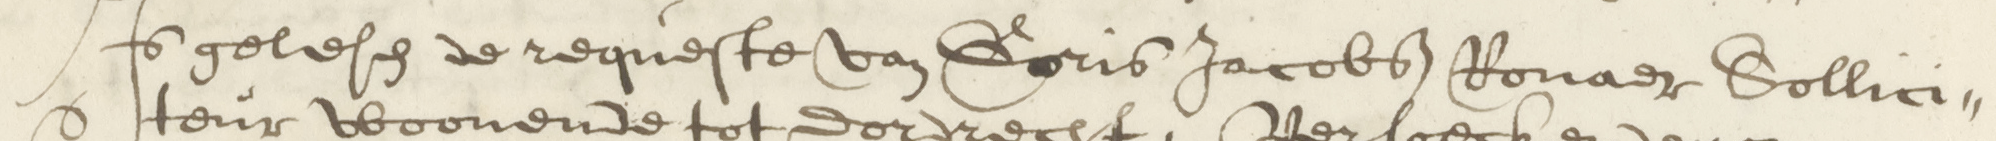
Is gelesen de requeste van Goris Jacobs Ronaer Sollici„
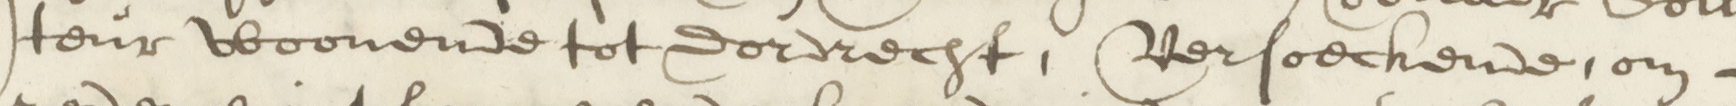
teur woonende tot Dordrecht, Versoeckende, om
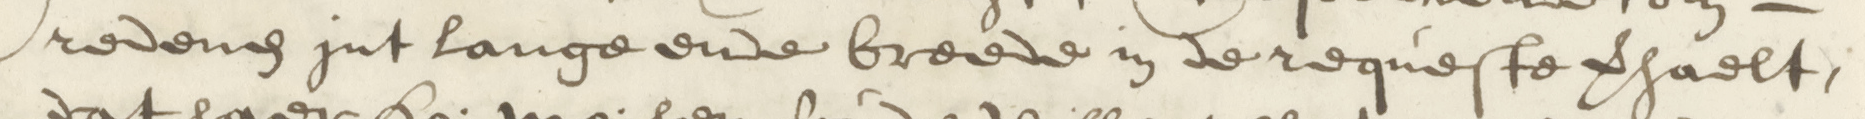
redenen int lange ende breede in de requeste vhaelt,
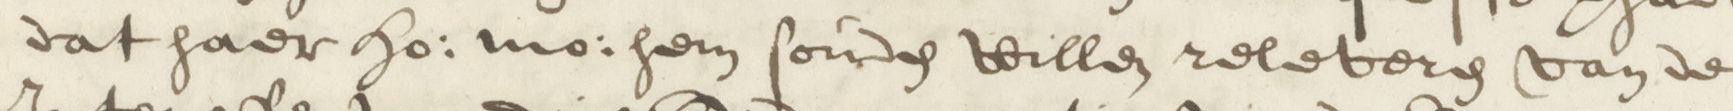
dat haer Ho:Mo: hem souden willen releveren van de
